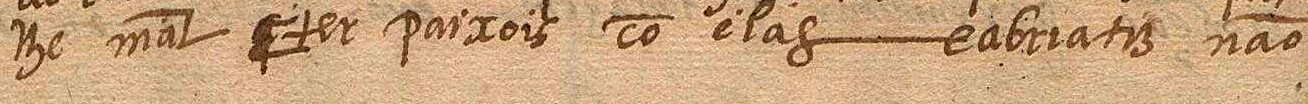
lhe māL E ter paixois c̄o elas e a briatiz não
